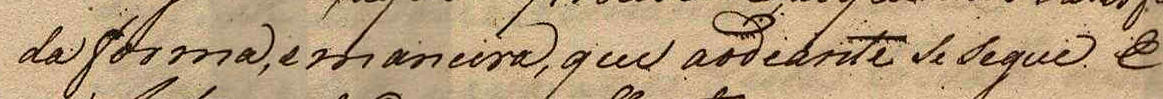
da forma, e maneira, que ao diante se segue. E
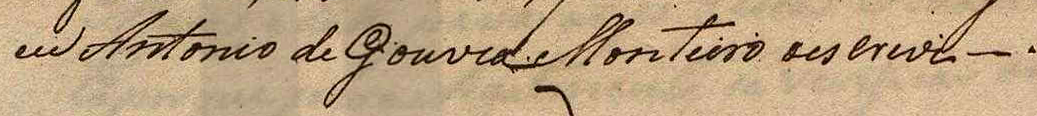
eu Antonio de Gouvea Monteiro o escrevi.
